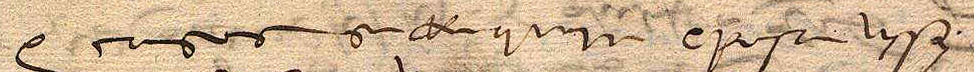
e casos se Requere e posa vysy
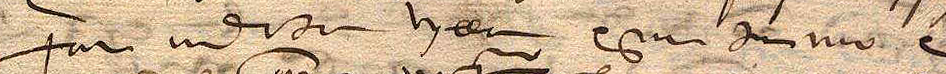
tar a dita vylla e seu termo e
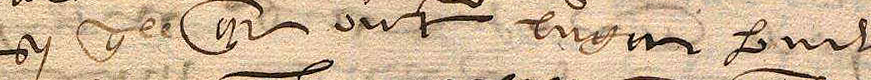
asy q̄llq̄r outro lugar honde
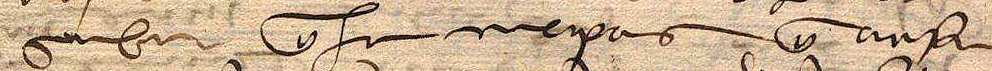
souber q̄ ha culpas q̄ a este
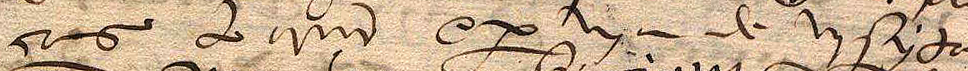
caso toquē e ꝑ vya de vysyta
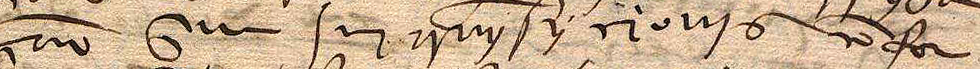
cão seu Jmquysycionjs c̄ofor
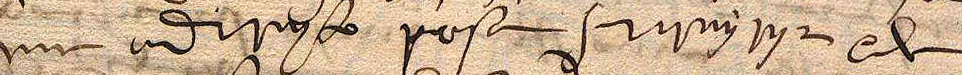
me a direyto posa Jmquyryr e de
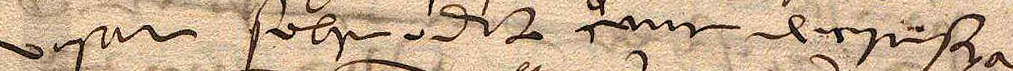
vasar sobre o dito cime de eresya
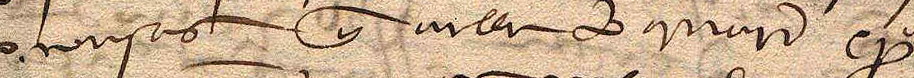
e cousas q̄ a elle toquarē e ꝓ
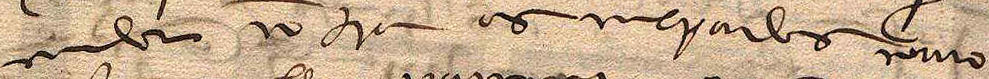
ceder c̄otra os culpados como
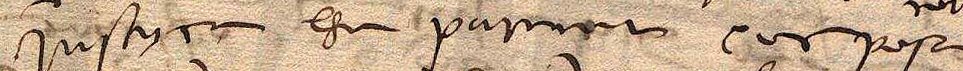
Justyça lhe pareçer e os posa
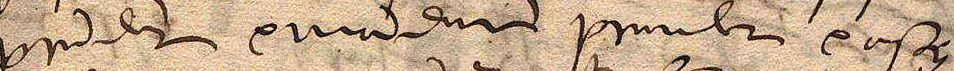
prēder e mādar prender e asy
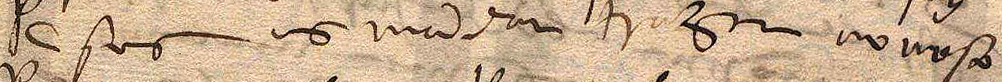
p̄sos os mādar trazer ao noso
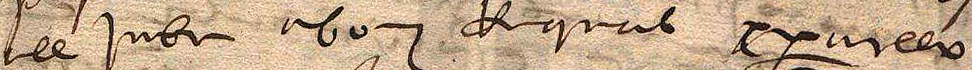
allJube a bom Requado e ꝑa ello
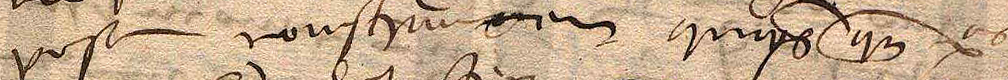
posa comstranger quaysq̄r pas
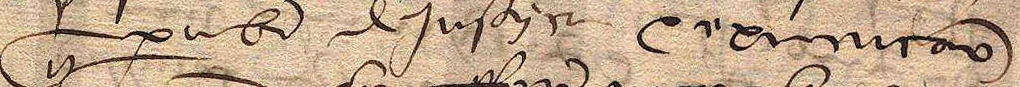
q̄ ꝑa bē de Justyca e execução
